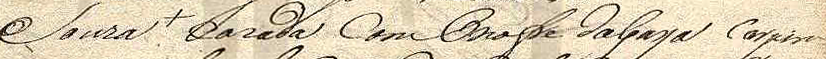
Souza + cazada com Onofre da Gaya carpin
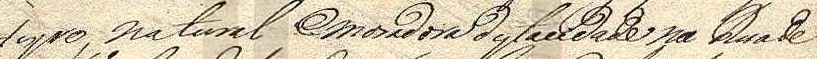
teyro, natural e moradora desta cidade na Rua de
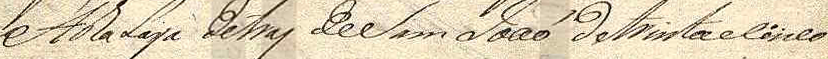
AthaLaya detras de sam Ioaõ de trinta e cinco
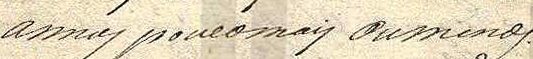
annos pouco mais ou menos.
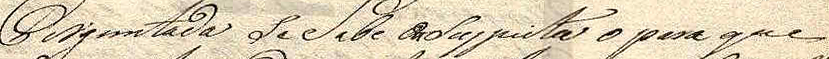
Perguntada se sabe ou suspeita o para que
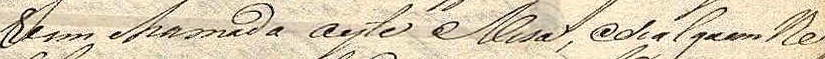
vem chamada a este Mesa, e se alguem lhe
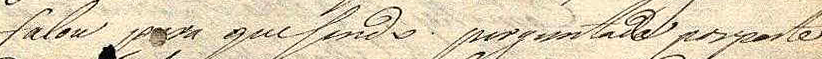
falou p_ra que sendo perguntada por parte
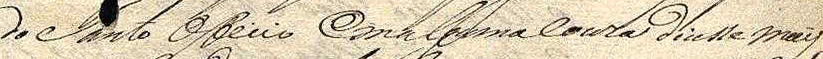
do santo Officio em alguma couza dicesse mais
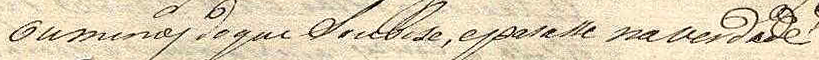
ou menos do que Soubesse, e pasasse na verdade?
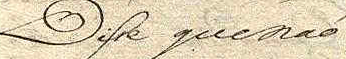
Dise que naõ
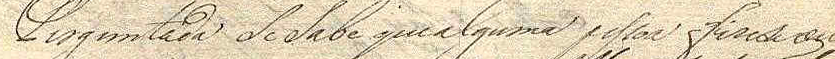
Perguntada se sabe que alguma pessoa fizese ou
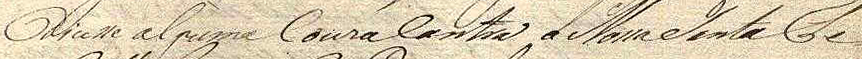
dicesse alguma Couza contra a Nossa Santa Fe
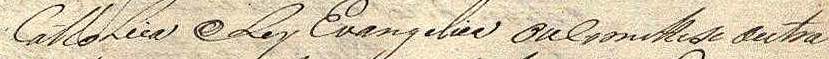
CathoLica e Ley Evangelica ou comettese outra
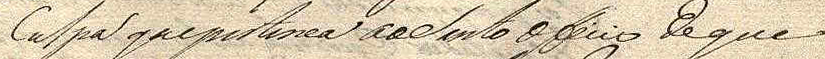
culpa que pertenca ao santo officio de que
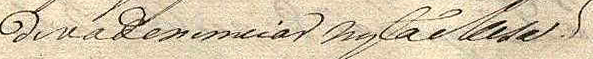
deva denunciar nesta Mesa?
